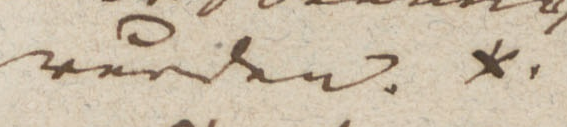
wurden. %
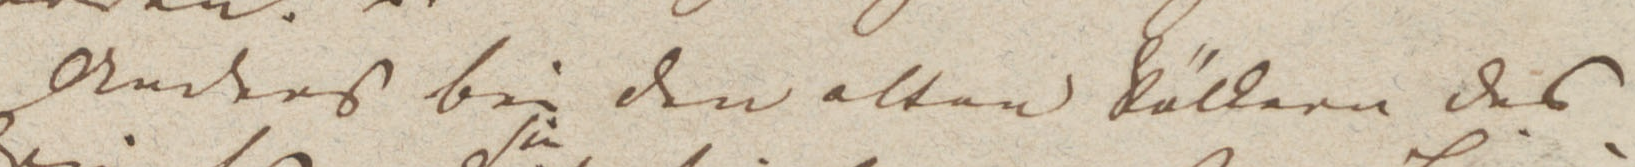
Anders bei den alten Völkern des
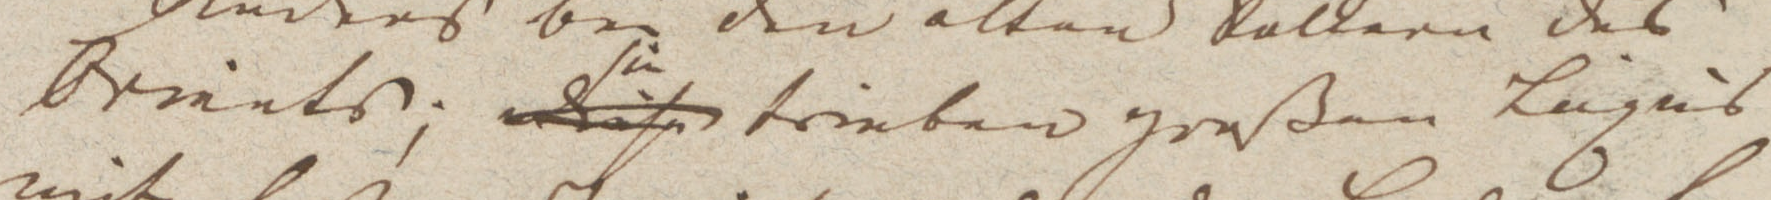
Orients; Diese sie trieben grossen Luxus
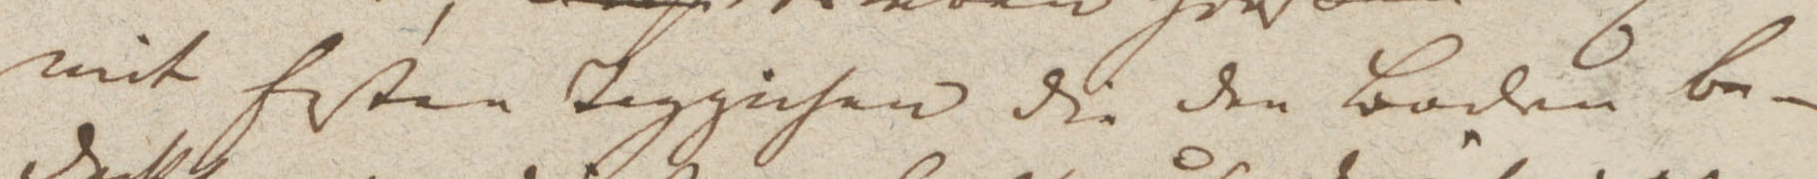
mit festen Teppichen die den Boden be-
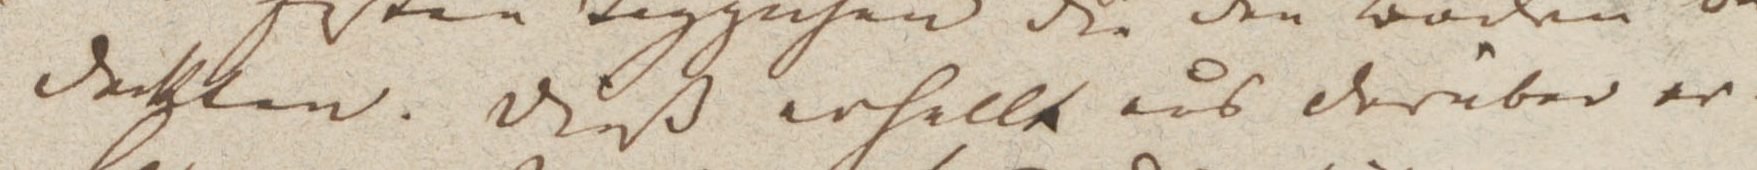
deckten. Diess erhellt aus darüber er-
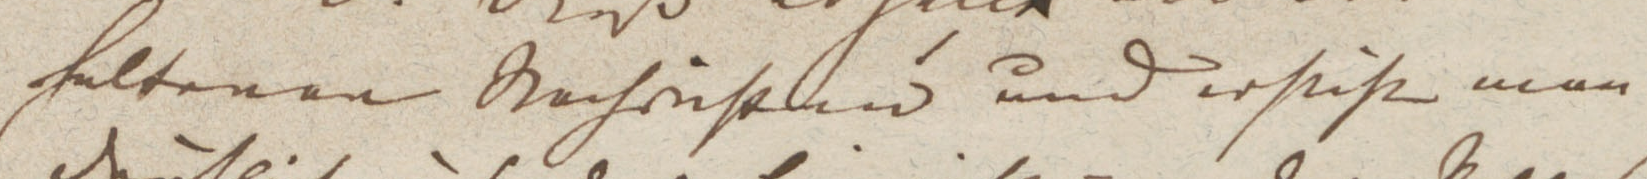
haltenen Nachrichten und ersieht man
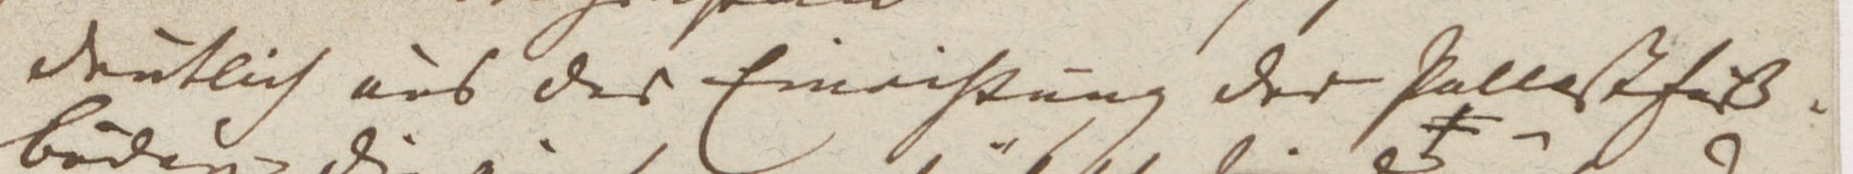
deutlich aus der Einrichtung der Pallastfuss-
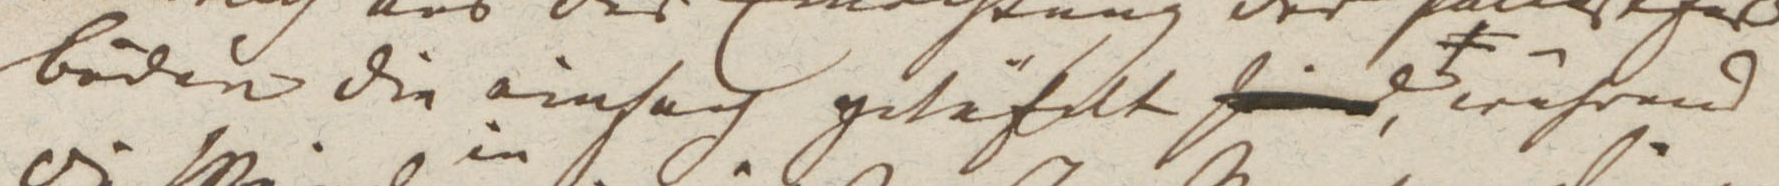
böden die einfach getäfelt sind, %während
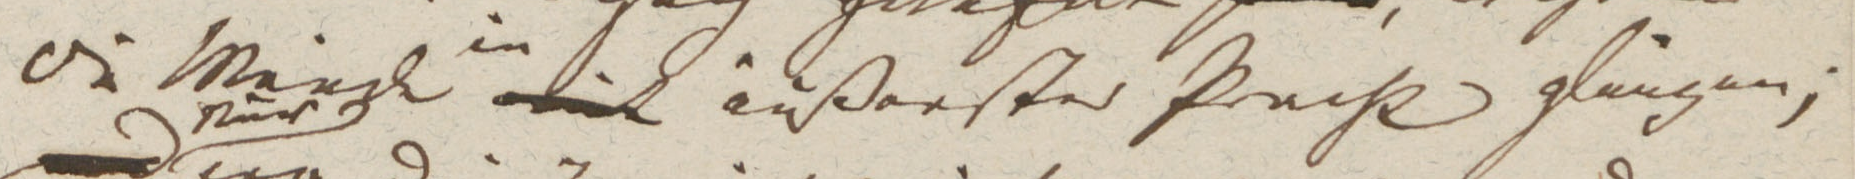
die Wände mit in äusserster Pracht glänzen;
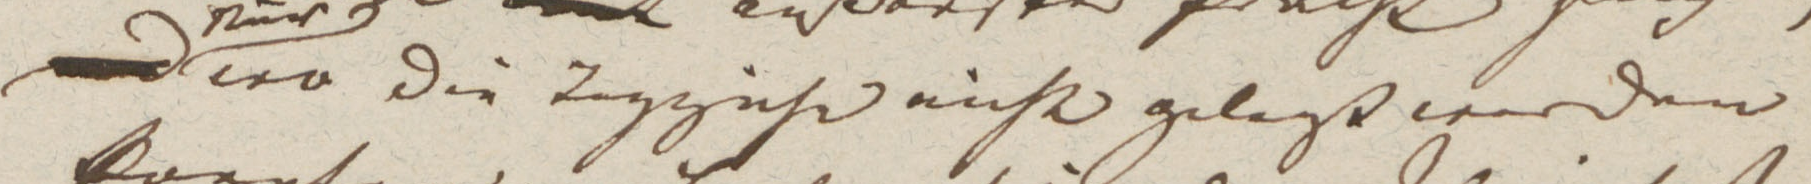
und Nur wo die Teppiche nicht gelegt werden
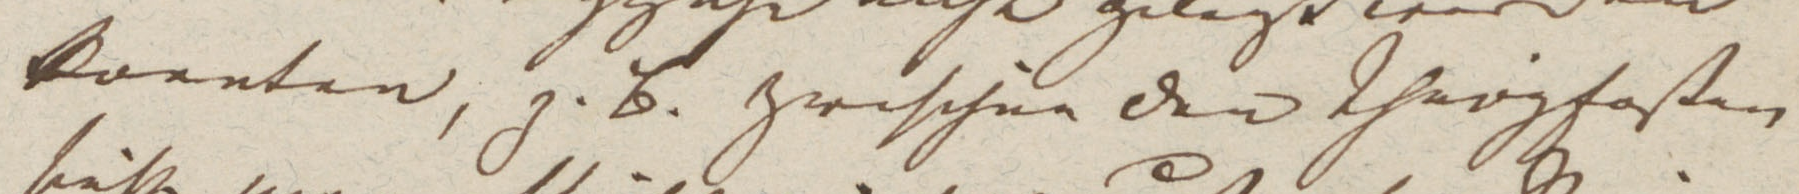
konnten, z. B. zwischen den Thürpfosten
